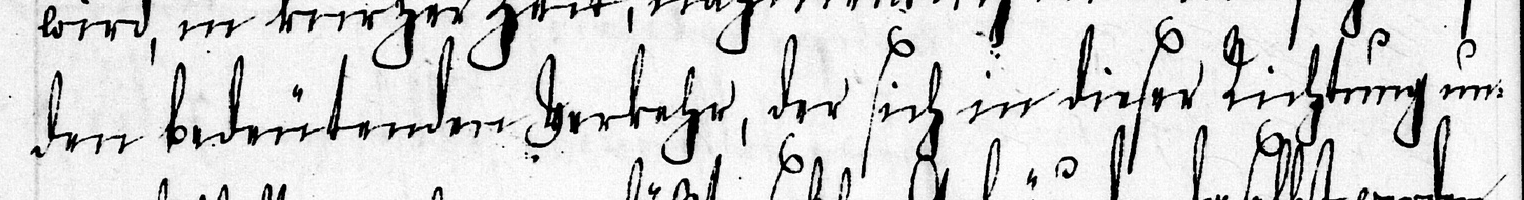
den bedeutenden Verkehr, der sich in dieser Richtung un¬
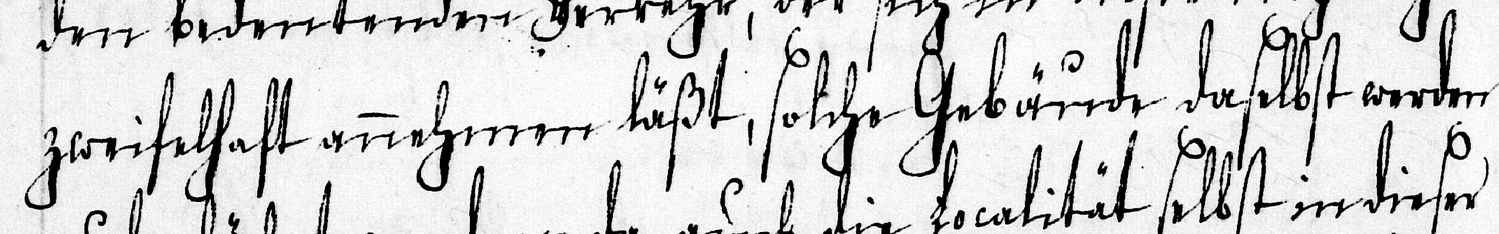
zweifelhaft annehmen läßt, solche Gebäude daselbst wer¬
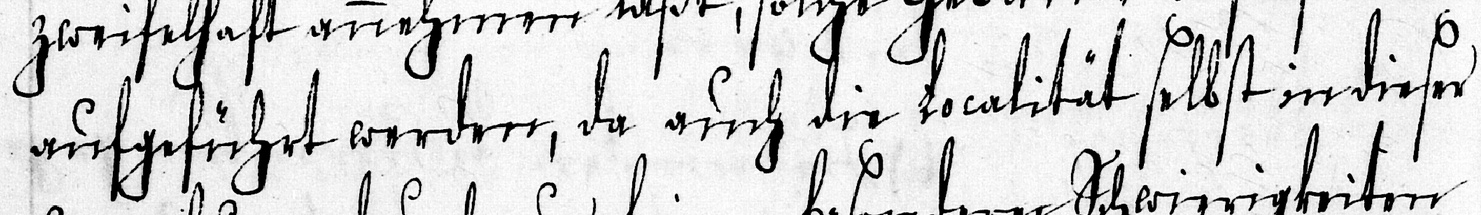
aufgeführt werden, da auch die Localität selbst in dieser
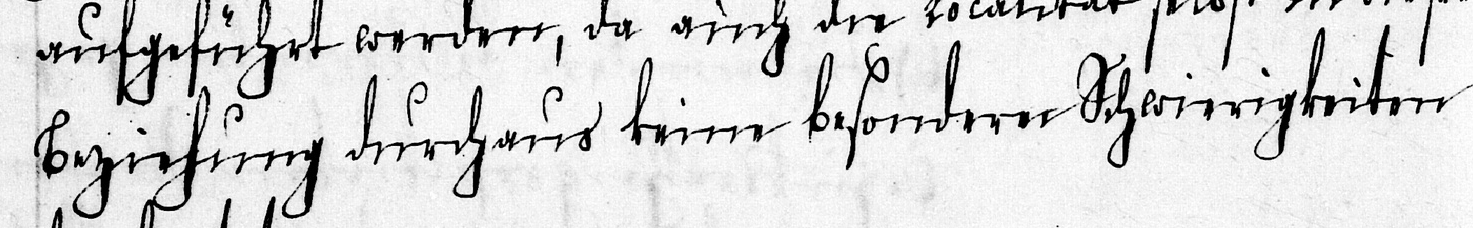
Beziehung durchaus keine besondern Schwierigkeiten
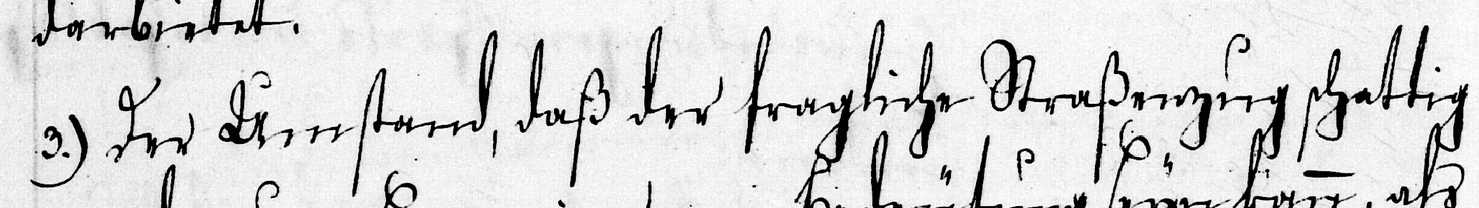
3.) Der Umstand, daß der fragliche Straßenzug schat¬
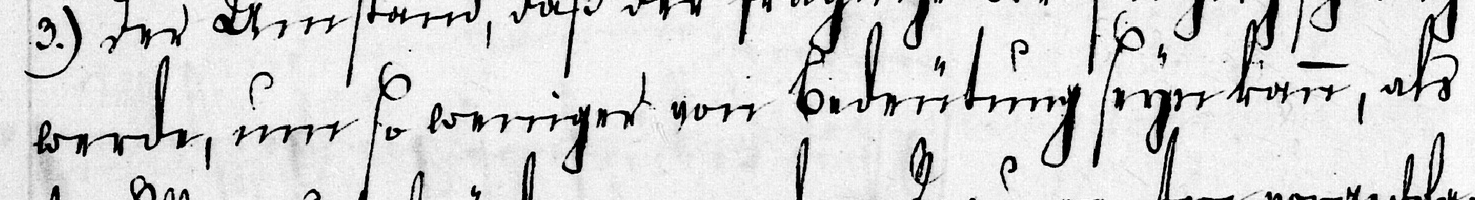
werde, um so weniger von Bedeutung seyn kann, als
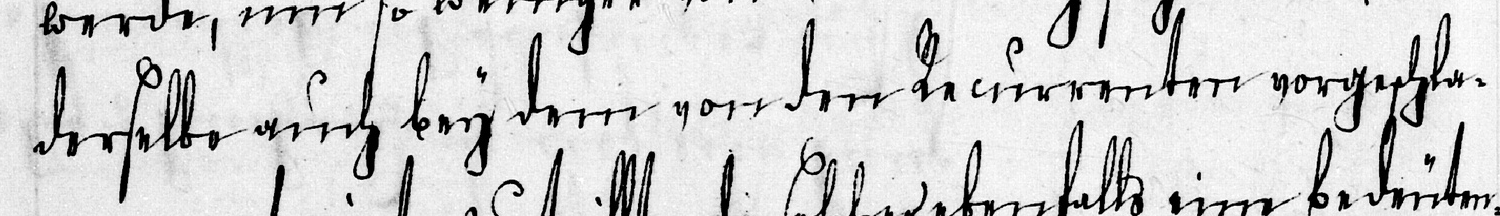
derselbe auch bey dem von den Recurrenten vorgeschla¬
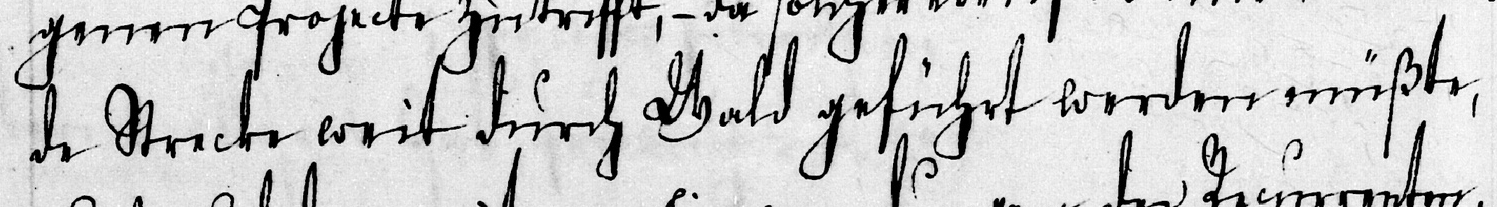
de Strecke weit durch Wald geführt werden müßte,
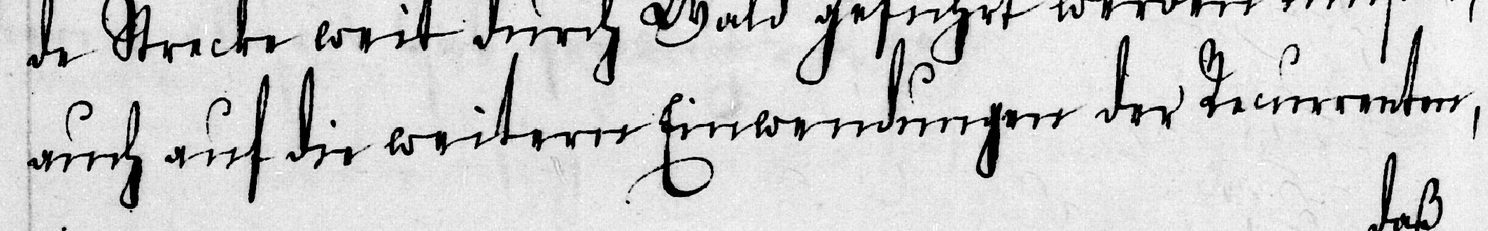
auch auf die weitern Einwendungen der Recurrenten,
